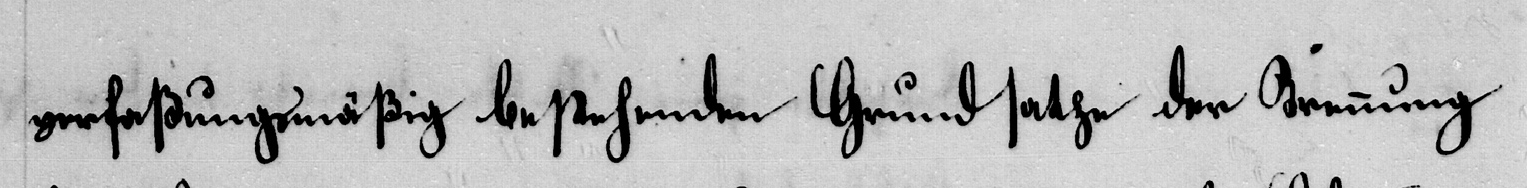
verfaßungsmäßig bestehenden Grundsatze der Trennung
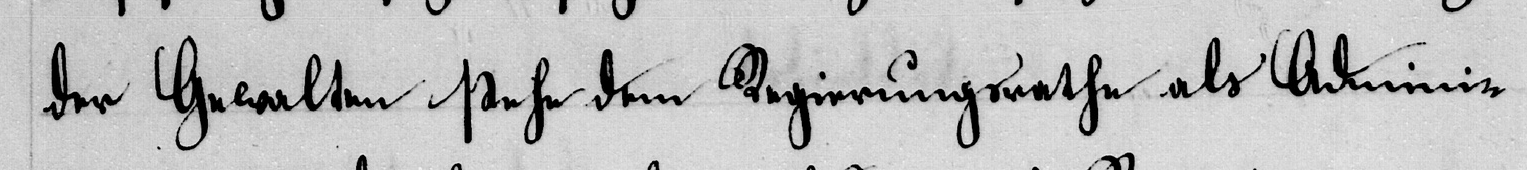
der Gewalten stehe dem Regierungsrathe als Admini¬
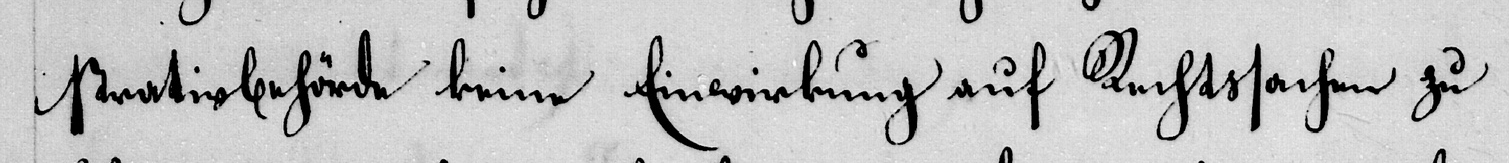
strationsbehörde keine Einwirkung auf Rechtssachen zu
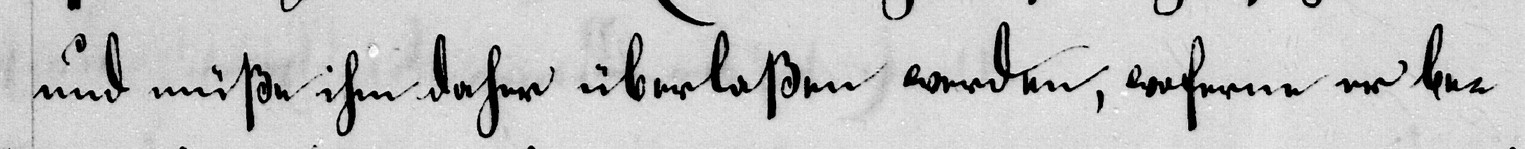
und müße ihm daher überlaßen werden, woferne er be¬
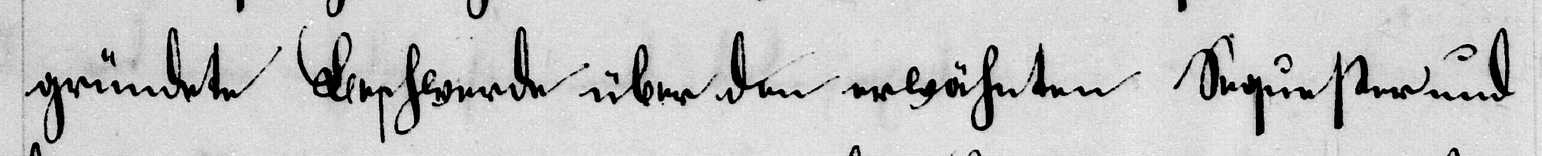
gründete Beschwerde über den erwähnten Sequester und
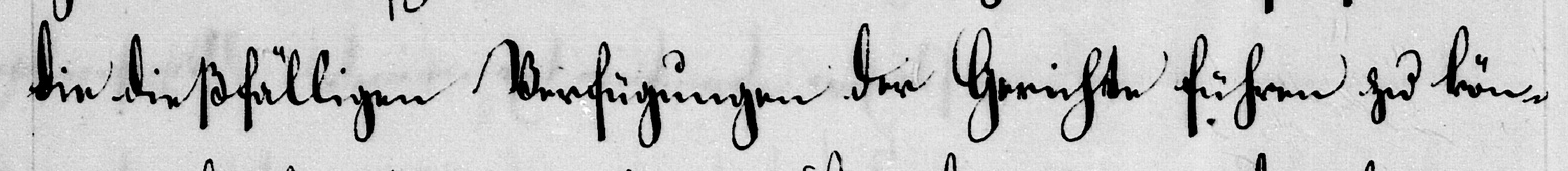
die dießfälligen Verfügungen der Gerichte führen zu kön¬
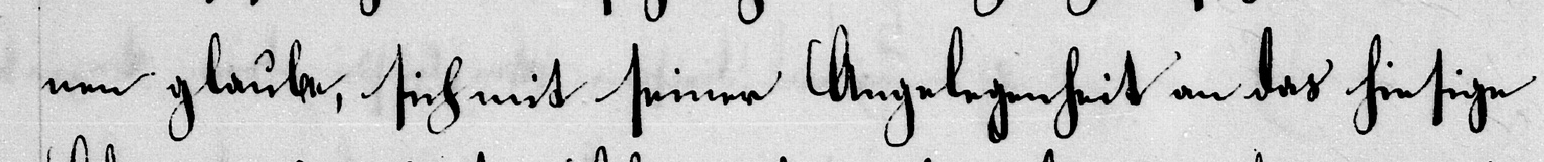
nen glaube, sich mit seiner Angelegenheit an das hiesige
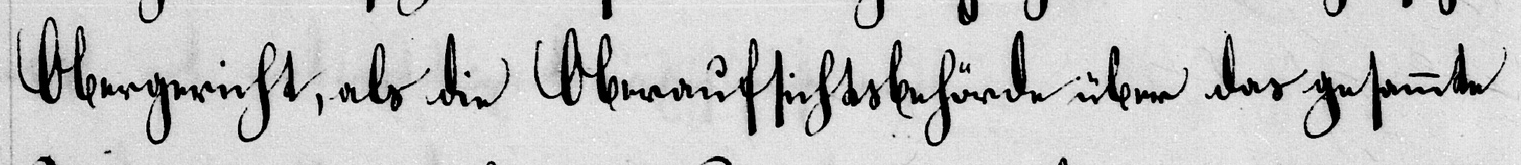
Obergericht, als die Oberaufsichtsbehörde über das gesammte
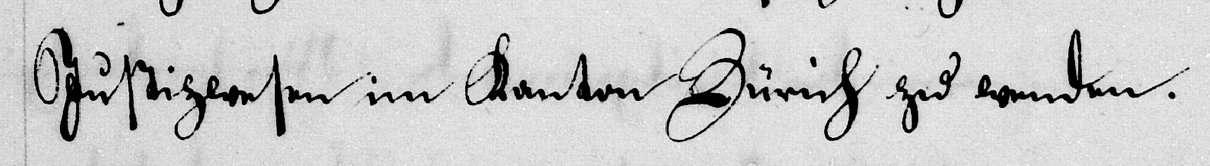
Justizwesen im Kanton Zürich zu wenden.
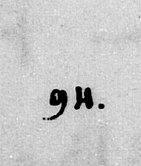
ge¬
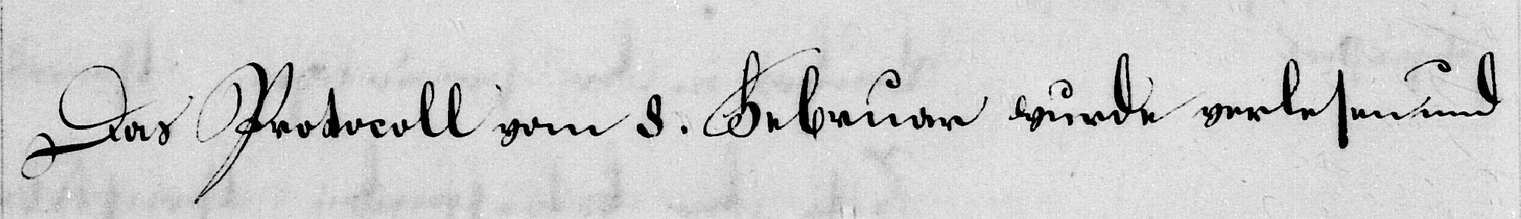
Das Protocoll vom 8. Februar wurde verlesen und
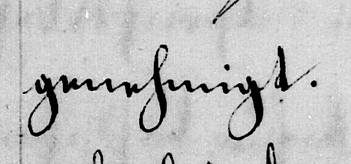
genehmigt.
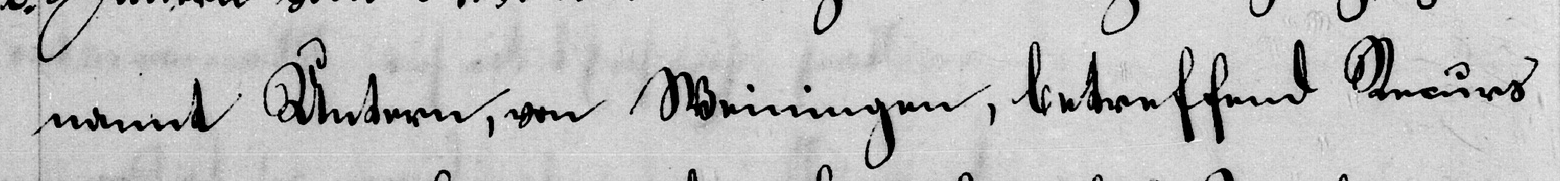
nannt Untern, von Weiningen, betreffend Recurs
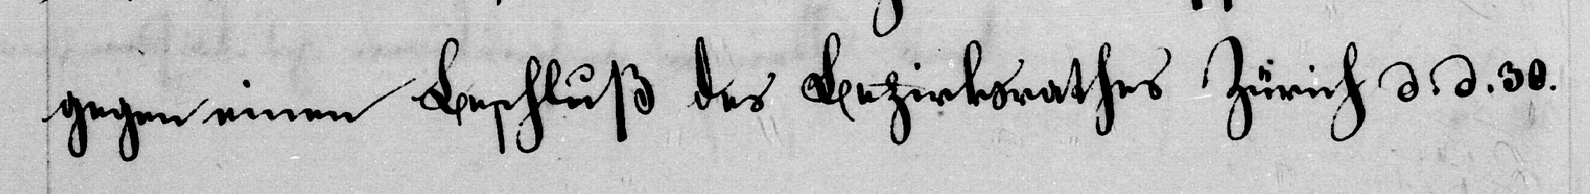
gegen einen Beschluß des Bezirksrathes Zürich d. d. 30.
